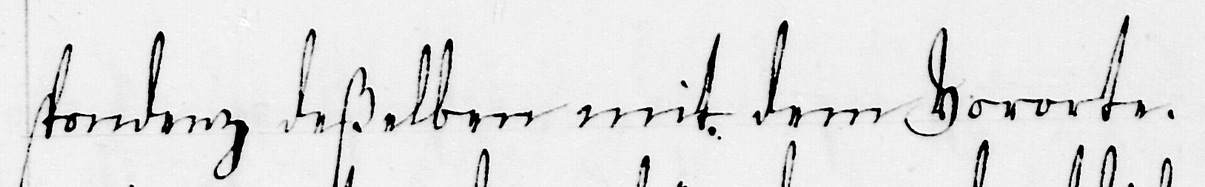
spondenz deßelben mit dem Vororte.
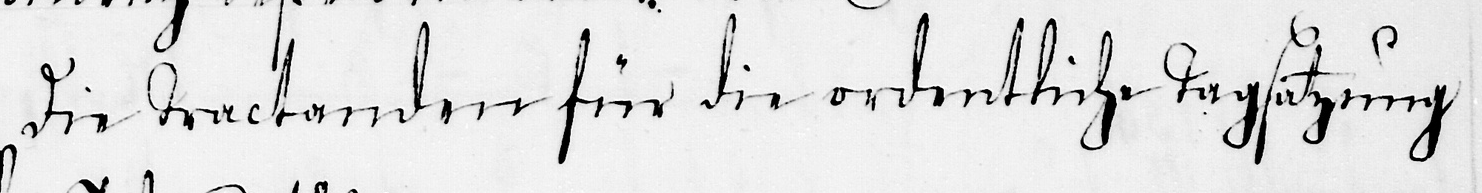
Die Tractanden für die ordentliche Tagsatzung
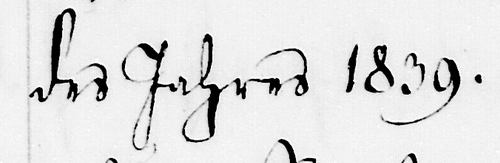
des Jahres 1839.
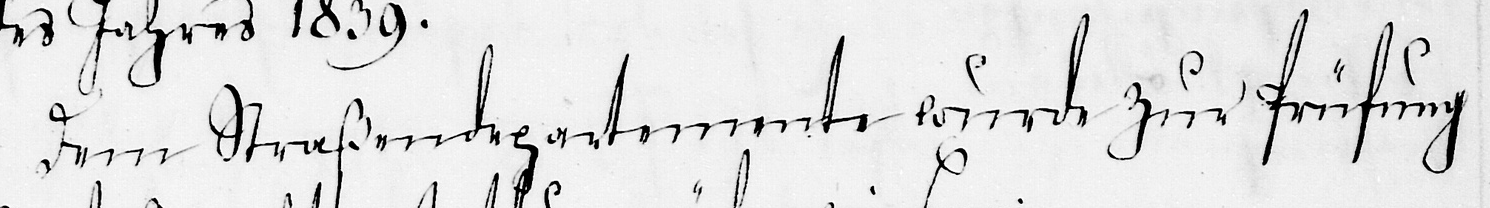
Dem Straßendepartemente wurde zur Prüfung
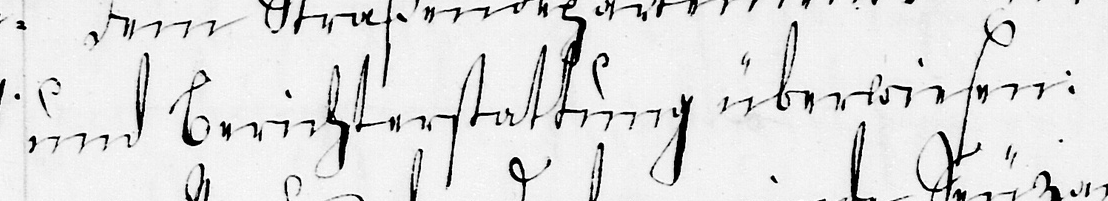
und Berichterstattung überwiesen:
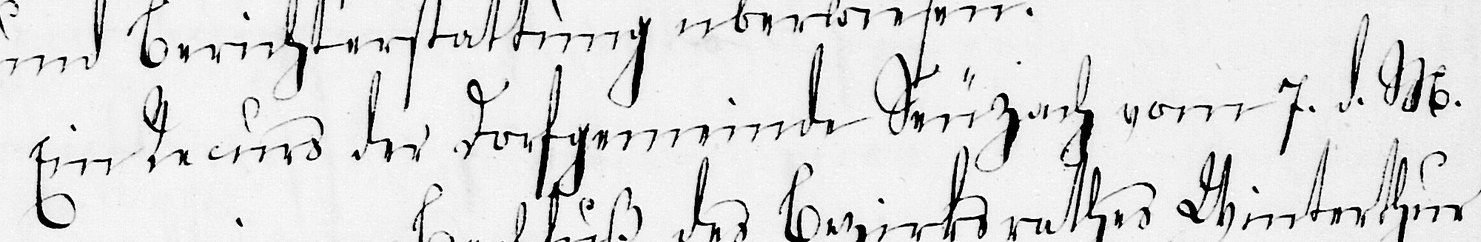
Ein Recurs der Dorfgemeinde Seuzach vom 7. d. M.
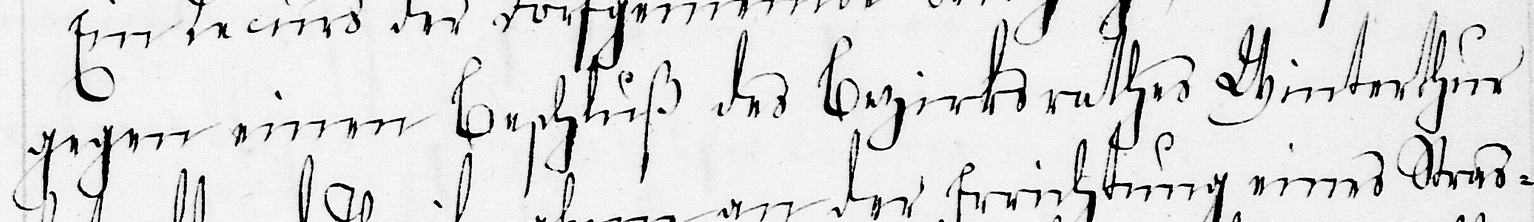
gegen einen Beschluß des Bezirksrathes Winterthur
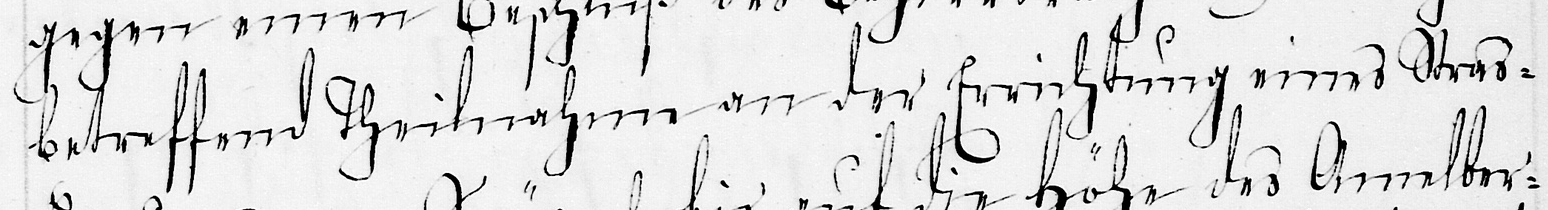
betreffend Theilnahme an der Errichtung eines Straß¬
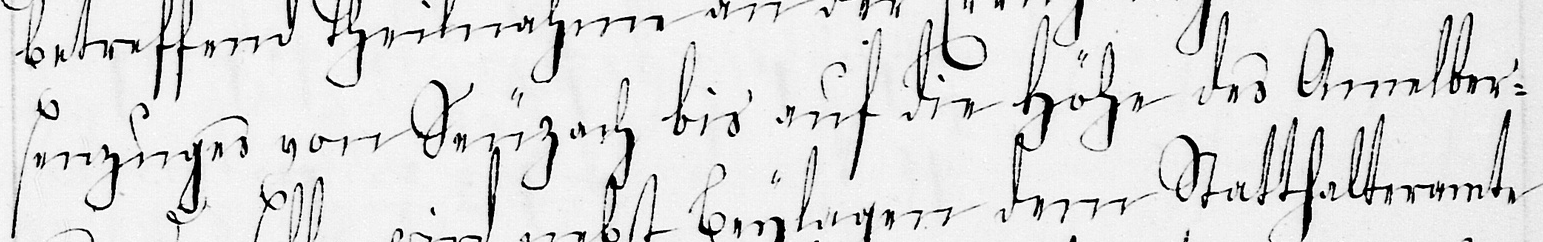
enzuges von Seuzach bis auf die Höhe des Amelber¬
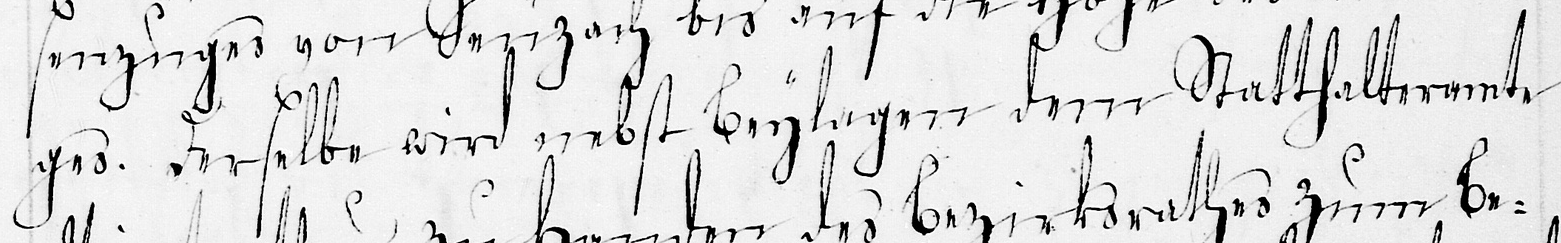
ges. Derselbe wird nebst Beylagen dem Statthalteramte
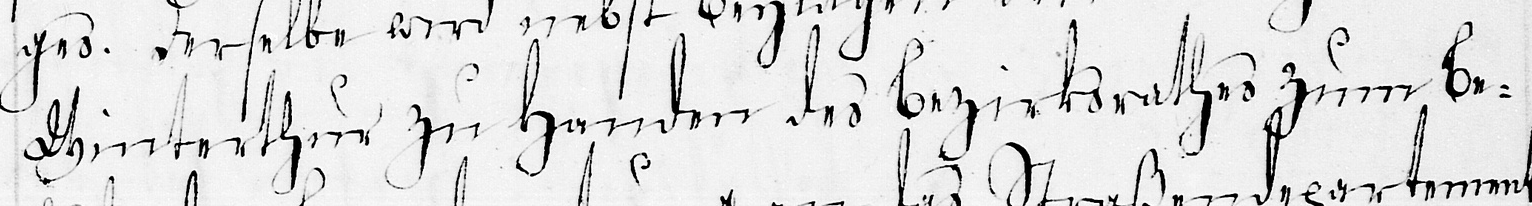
Winterthur zu Handen des Bezirksrathes zum Be¬
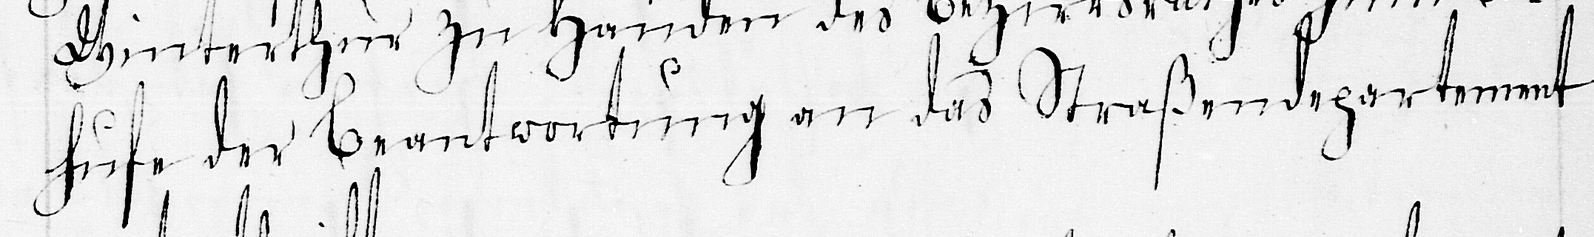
hufe der Beantwortung an das Straßendepartement
